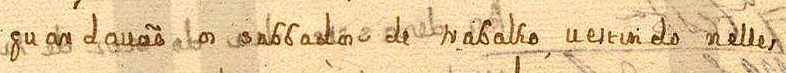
guardauão os sabbados de trabalho, uestindo nelles
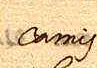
camis
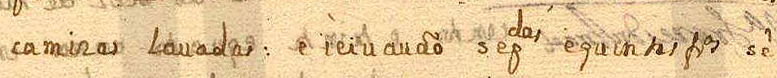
camizas lauadas: e ieiuauão segdas e quintas fras sē
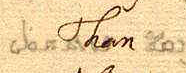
Than
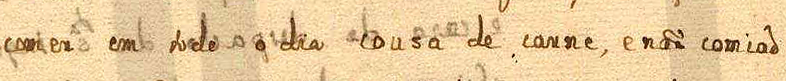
comer em todo o dia cousa de carne, e não comiaõ
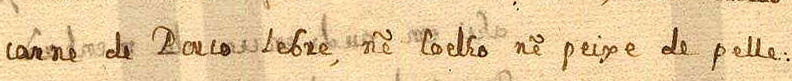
carne de Pouco Lebre, nē Coelho nē peixe de pelle
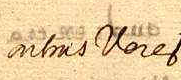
outras Vezes
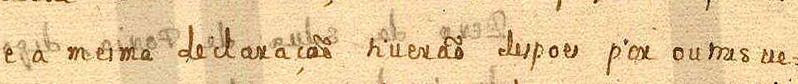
e a mesma declaração tiuerão despoes por outras ue
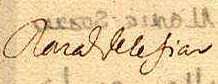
Razā de se fiar
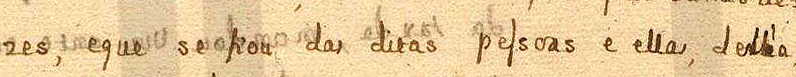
zes, e que se fiou das ditas pessoas e ellas delle
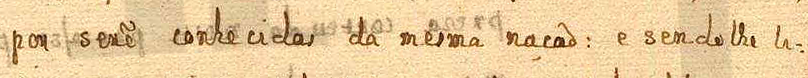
por serē conhecidas da mesma naçaõ: e sendo lhe li
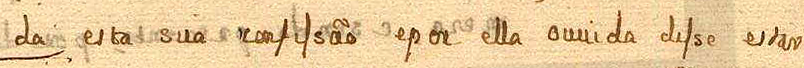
da esta sua confissão e por ella ouuida disse estar
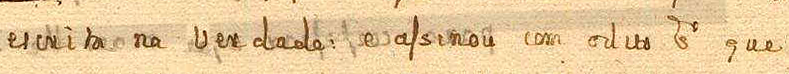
escrita na verdade e assinou com o dito sor que
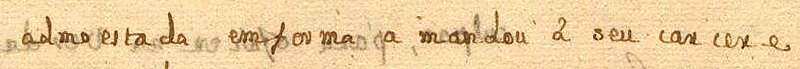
admoestada em forma a mandou á seu carcere
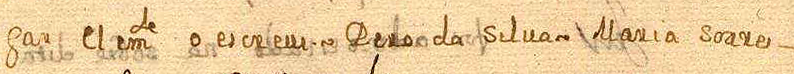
Gar Clemte o escreui - Pero da Silua - Maria Soares
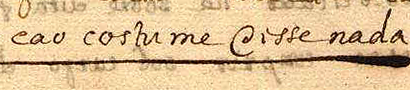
e ao costume disse nada
